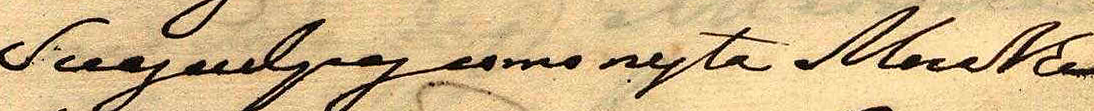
Suas culpas como nesta Meza lhe
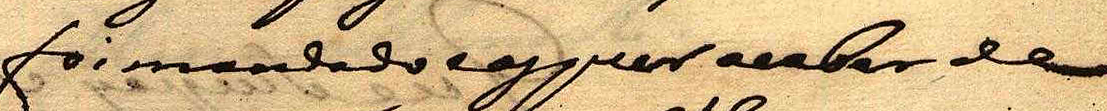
foi mandado e as quer acabar de
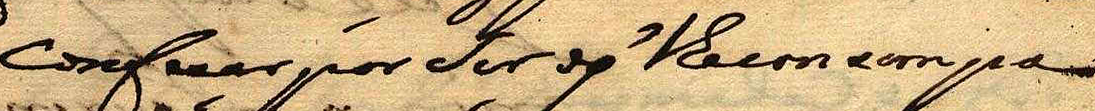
confeçar por Ser o q̄ lhe convem pa
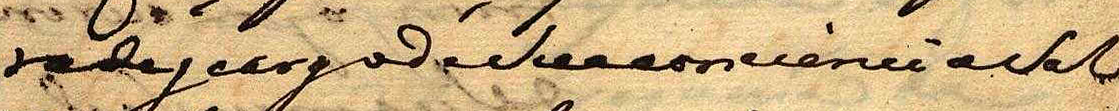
ra descargo de Sua conciencia Sal
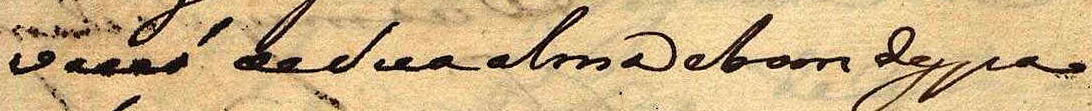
vaçaõ de Sua alma e bom despa
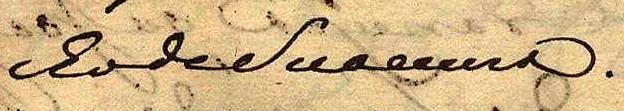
cho de Sua cauza.
